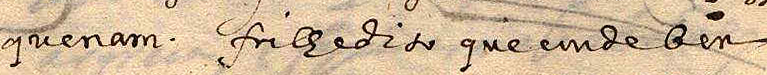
que nam. foilhe dito que cuide bem
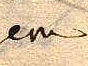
em
